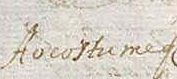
Ao costume q̄
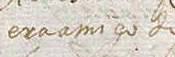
era amigo do
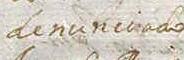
denunciado
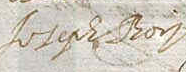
Joseph Roiz
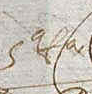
5a ta
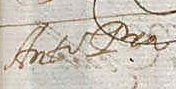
Anto P.ra
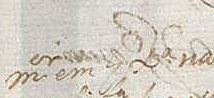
mor em Lxa na
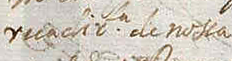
rua dir.ta de nossa
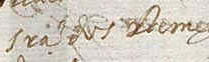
sra dos Reme
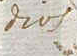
dios
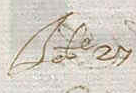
Id̄e 27
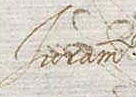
Juramto.
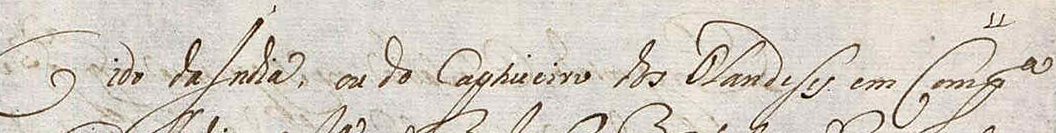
ido da Jndia, ou do Captiueiro dos Olandeses em Compa
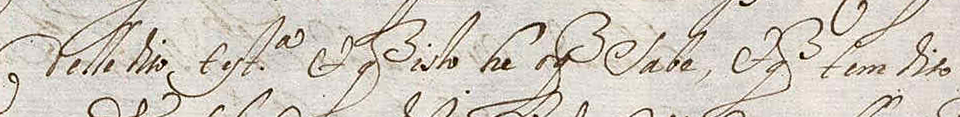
delle dito test.a & q̄ isto he o q̄ Sabe, & q̄ tem dito
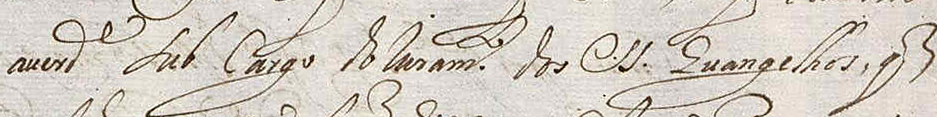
a uerde Sub Cargo do Iuram.to dos S.S. Euangelhos, q̄
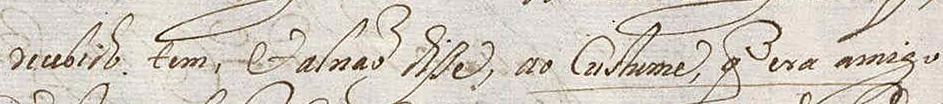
recebido tem, & al naõ disse, ao Custume, q̄ era amigo
